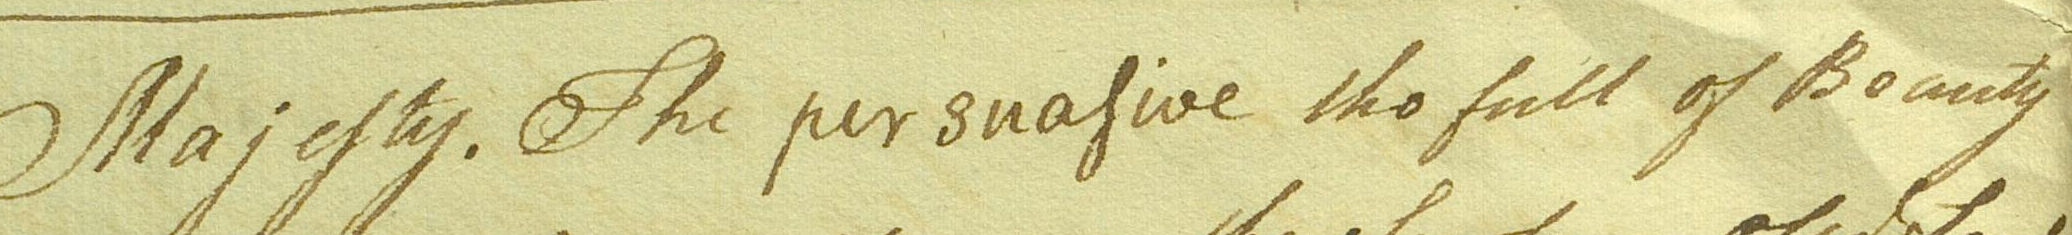Majesty. The persuasive tho full full of Beauty
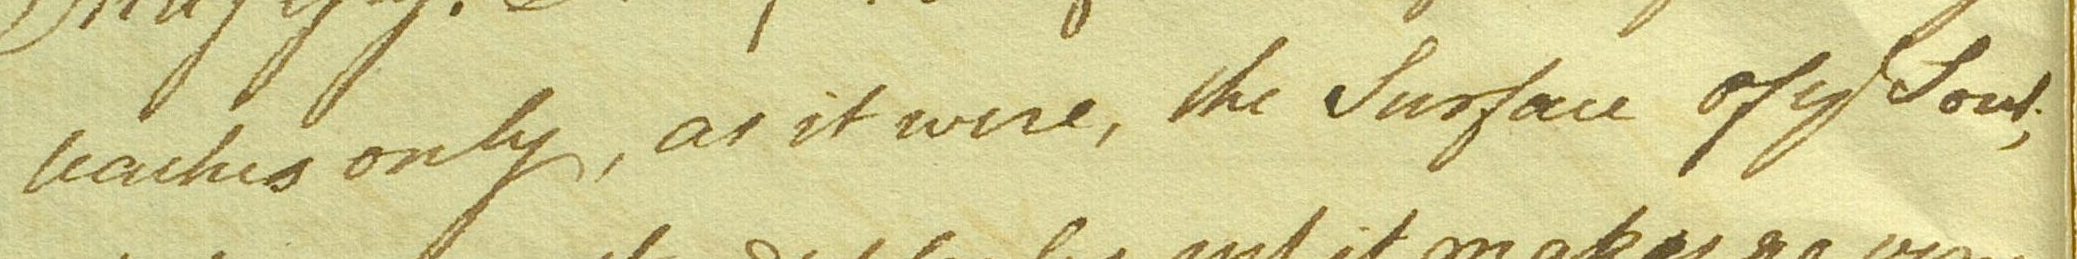reaches only, as it were, the Surface of y^e Soul,
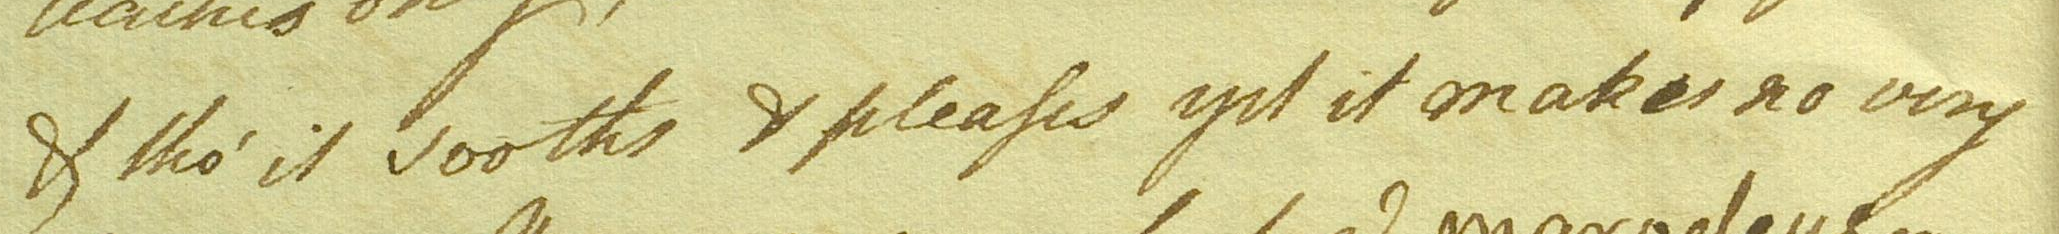& tho' it sooths & pleases yet it makes no very
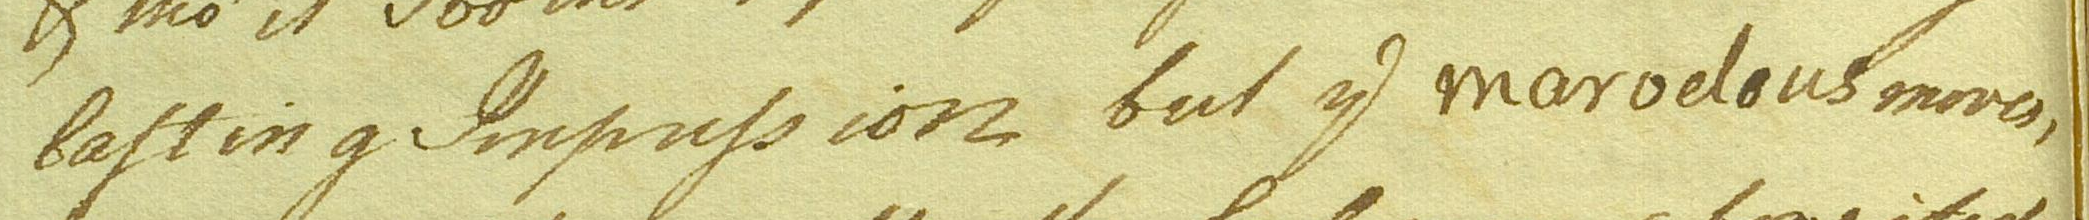lasting Impression but y^e marvelous moves,
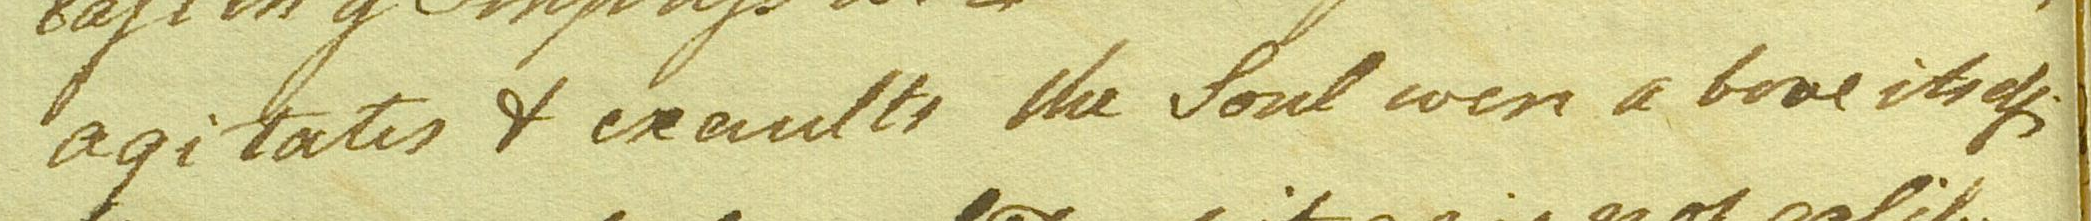agitates & exaults the Soul even above itself
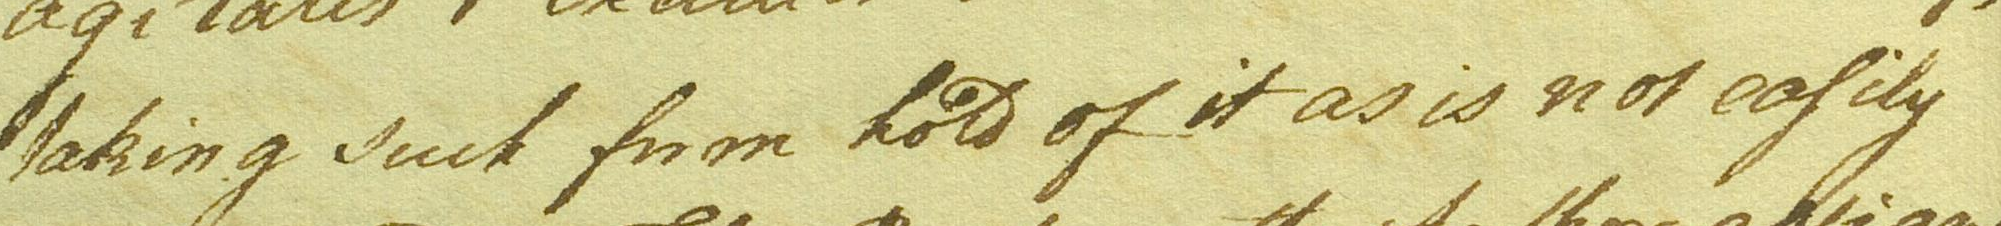taking such firm hold of it as is not easily
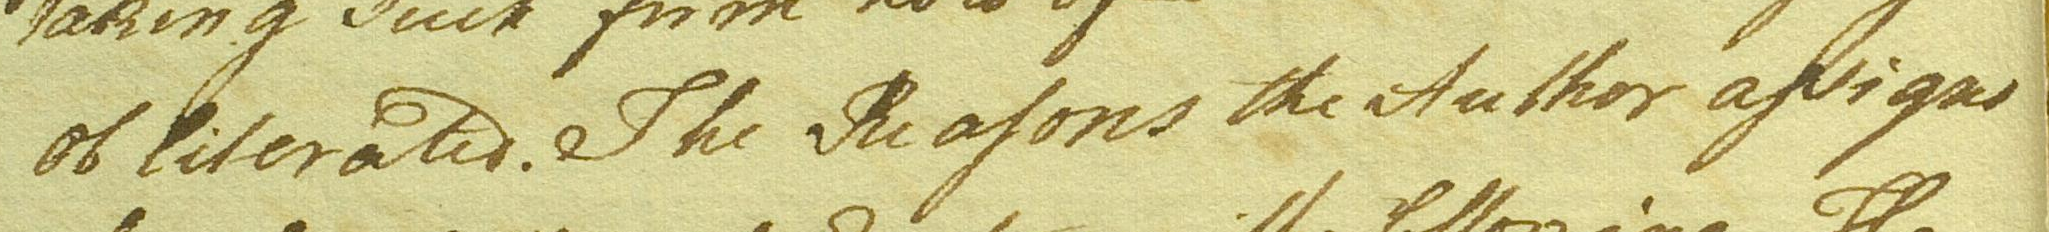obliterated. The Reasons the Author assigns
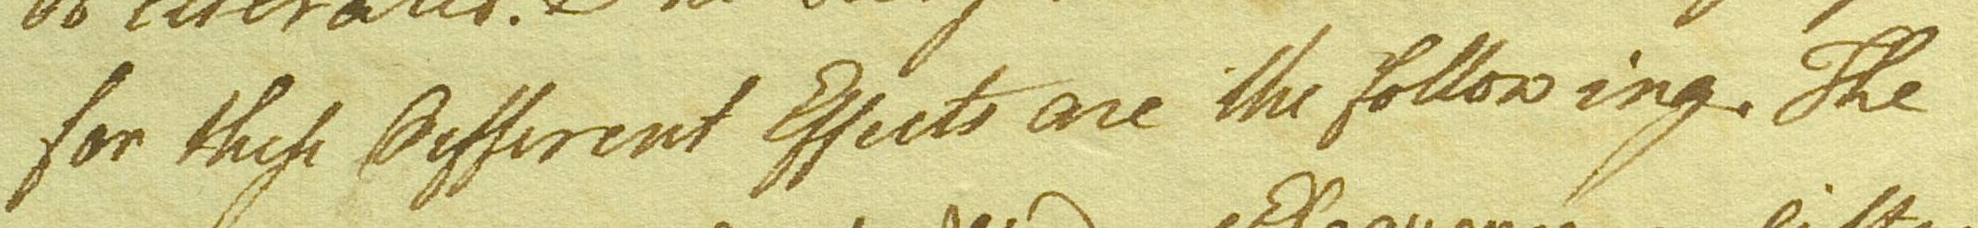for these different Effects are the following. The
